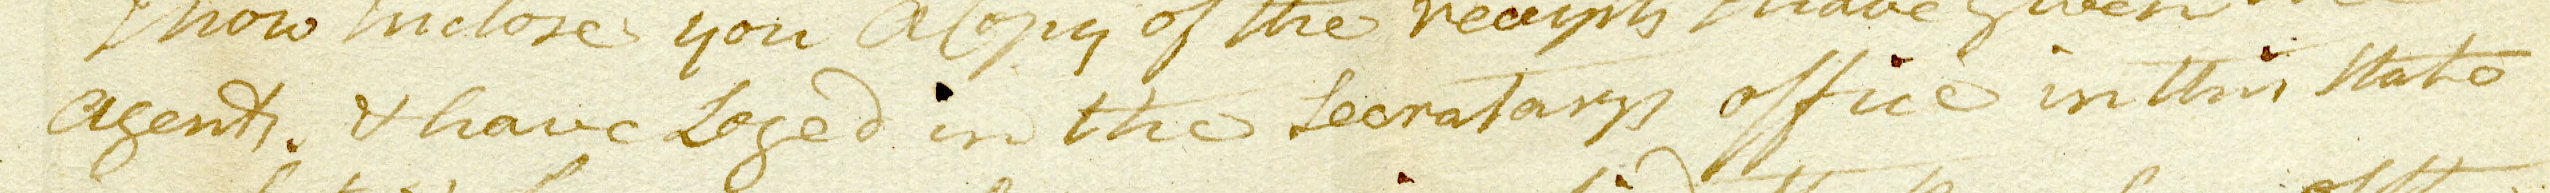agents & have Loged in the Secratarys office in this state
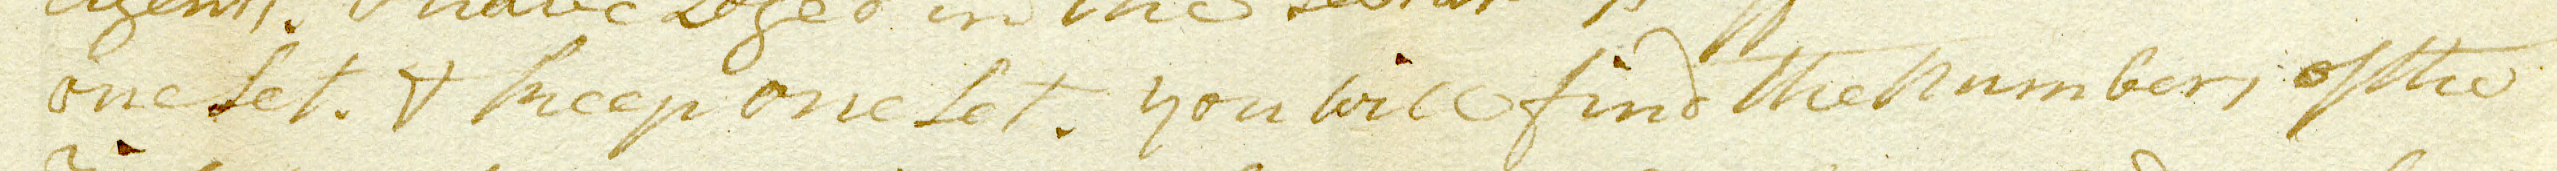one Set. & keep one Set. You will find the number of the
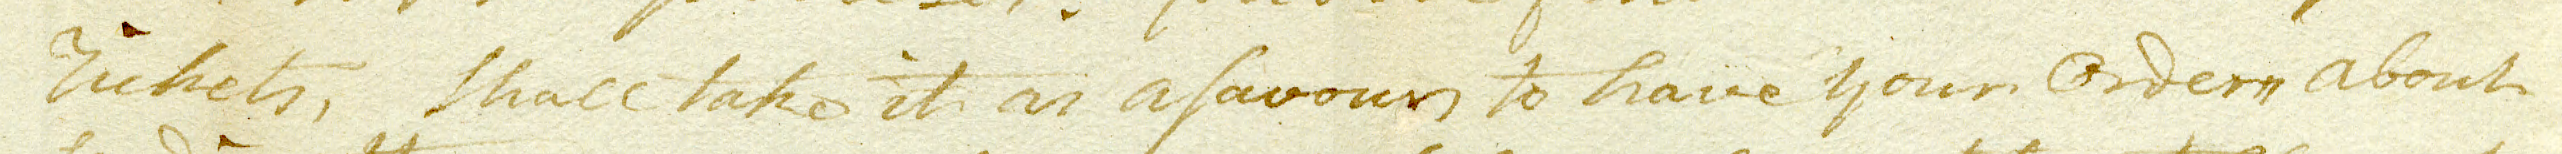Tickets, shall take it in a favour to have your order about
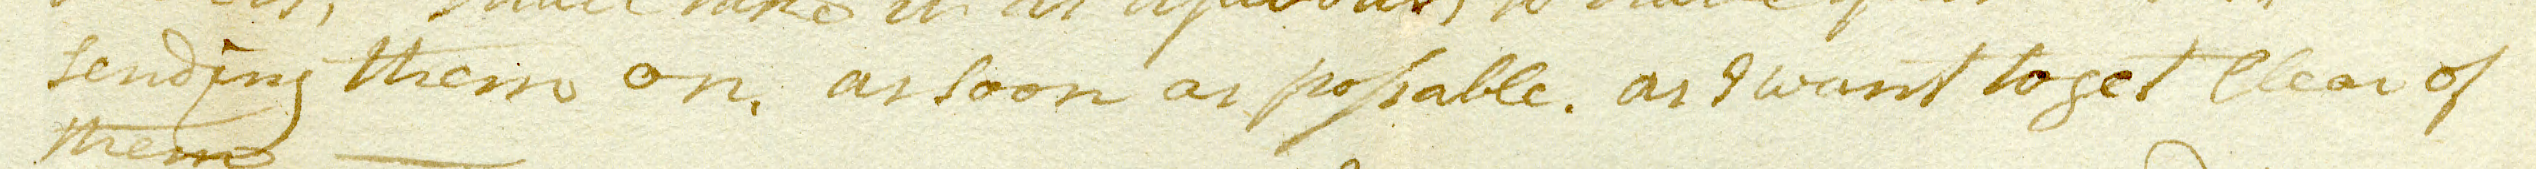sending them on, as soon as possable. as I want to get clear of
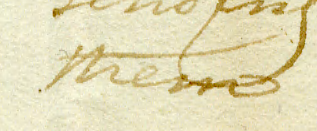them-
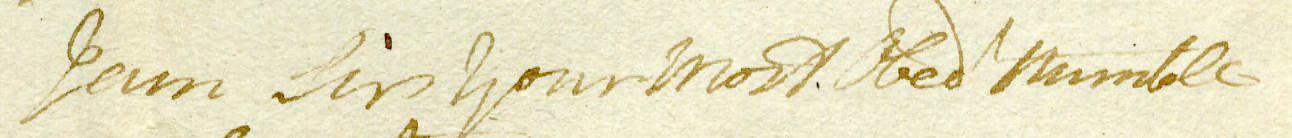I am sir your most Obed^t Humble
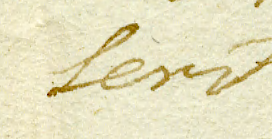Serv^t
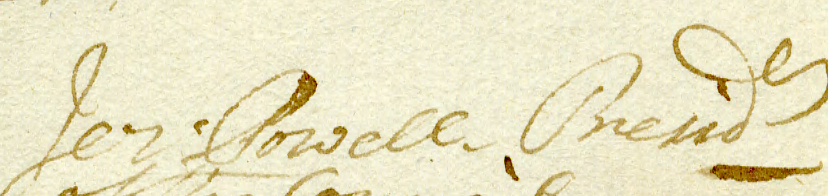Jer. Powerll Presd^t
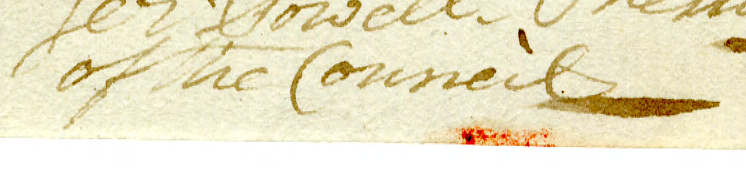of the Council
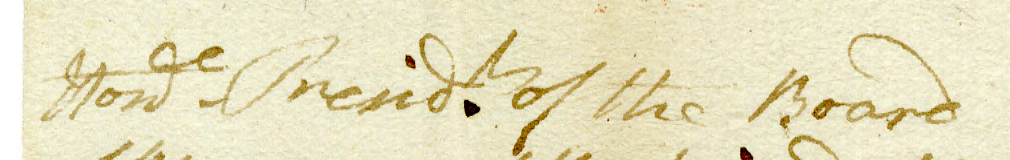Hon^be Presid^t of the Board
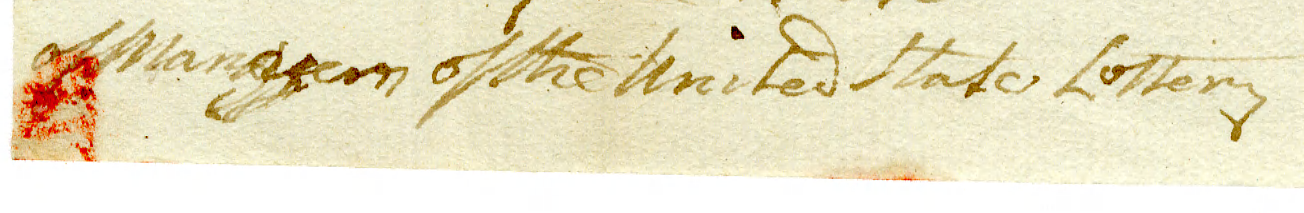of Managers of the United State Lottery
